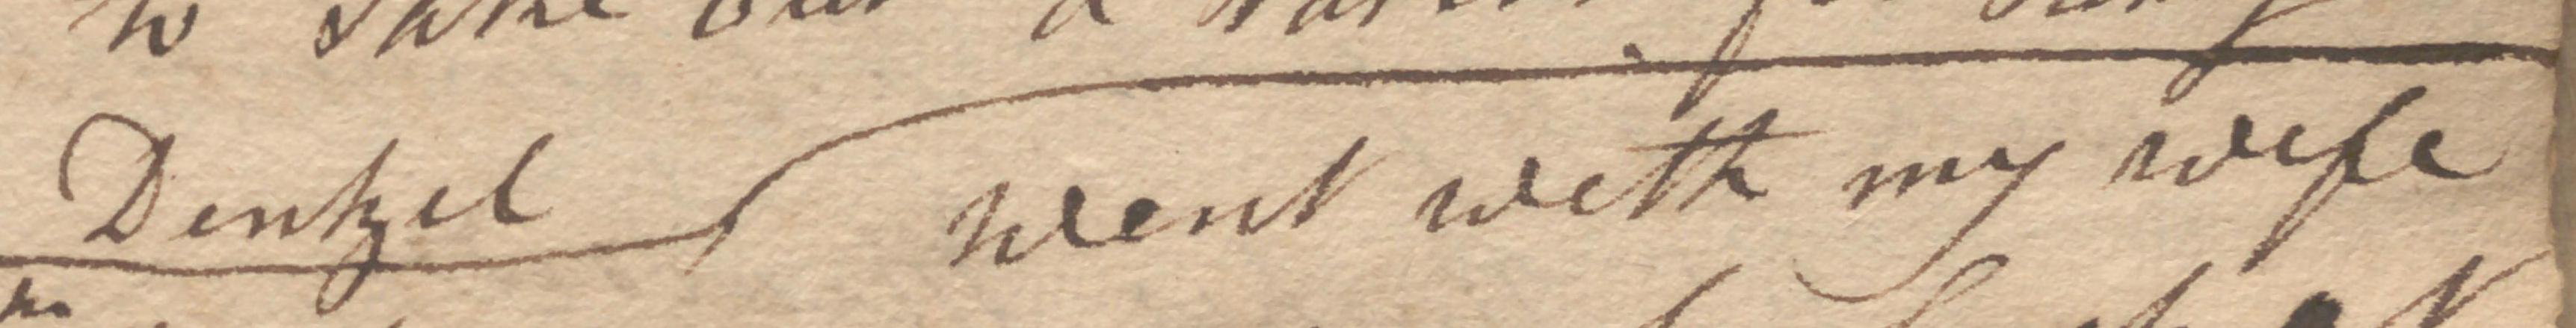Dentzel went with my wife
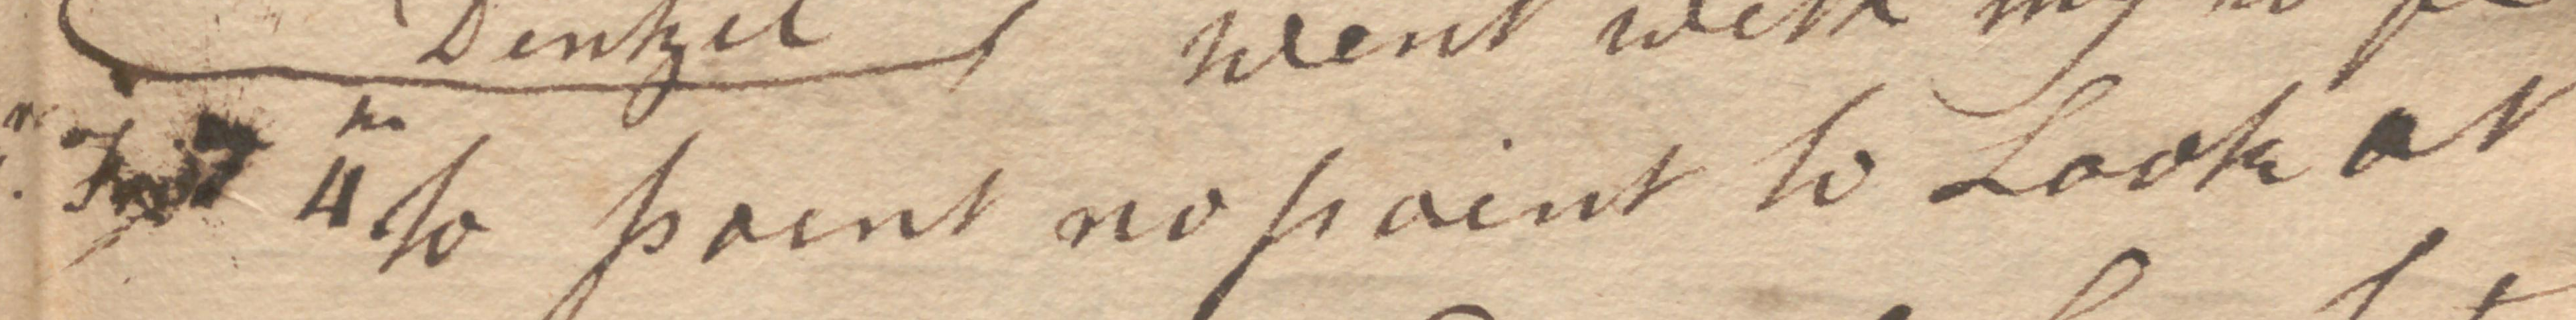[___] 4^th to point nopoint to Look at
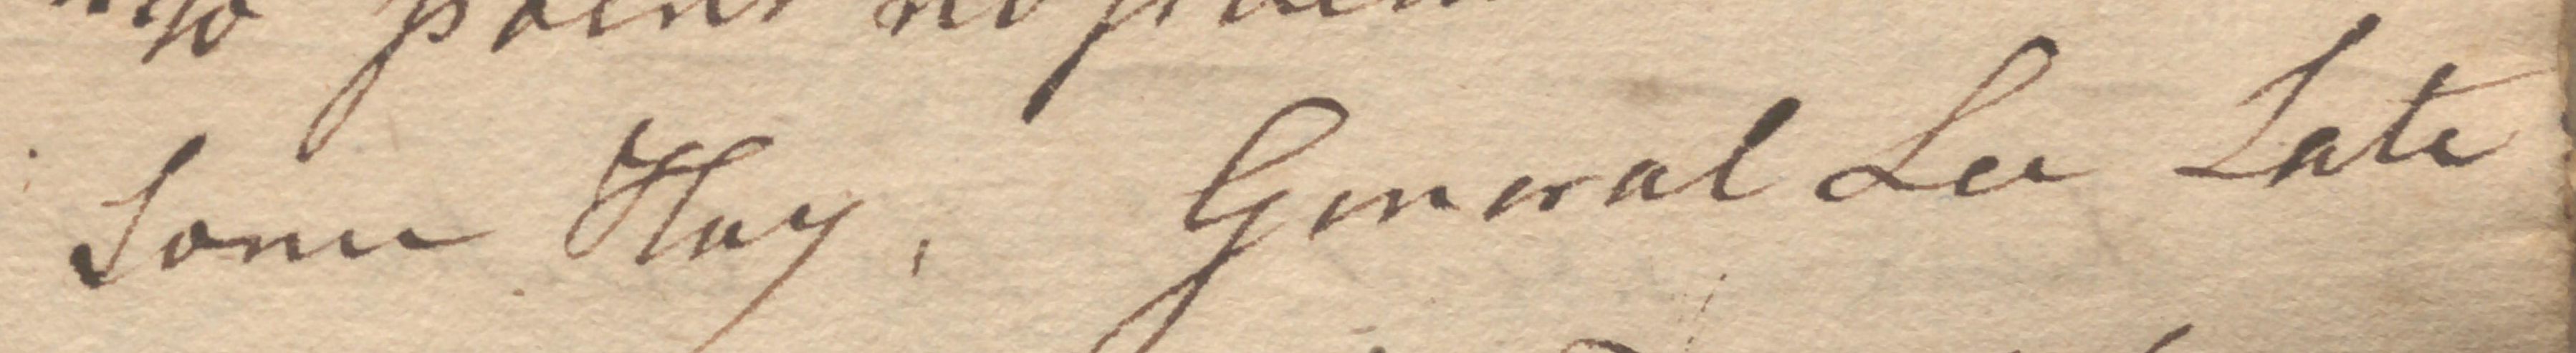some Hay. General Lee Late
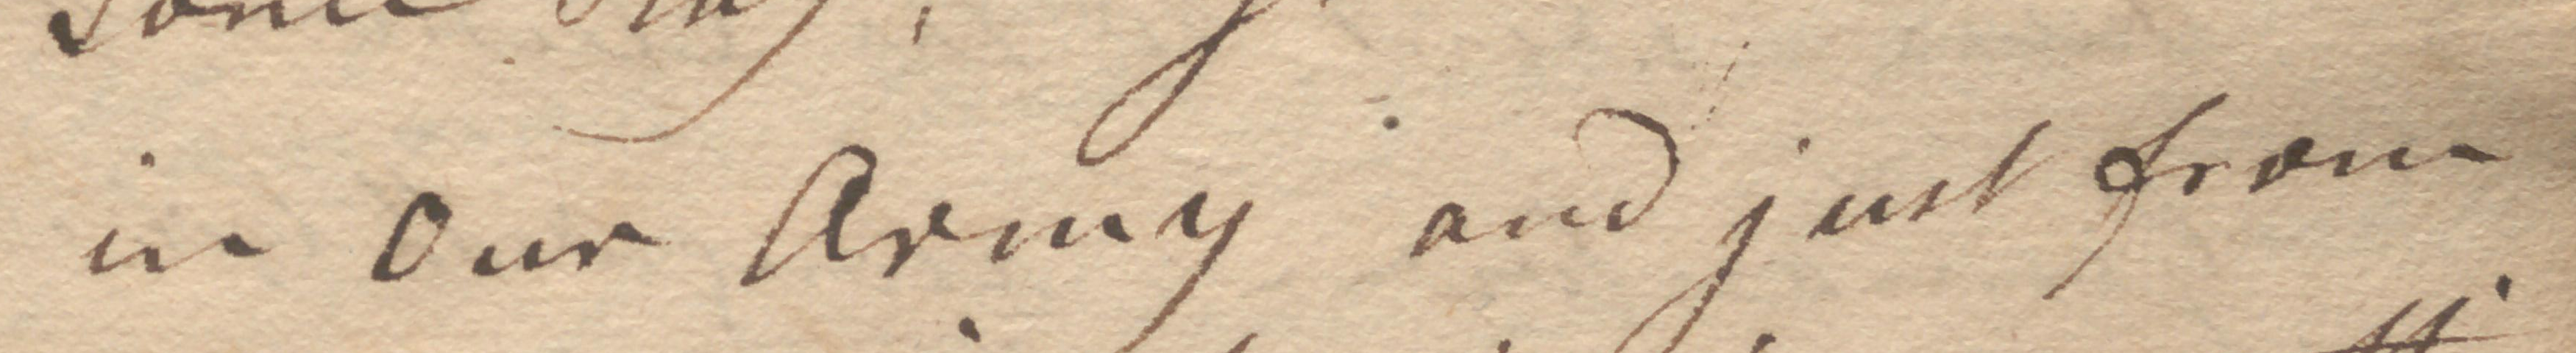in our Army and just from
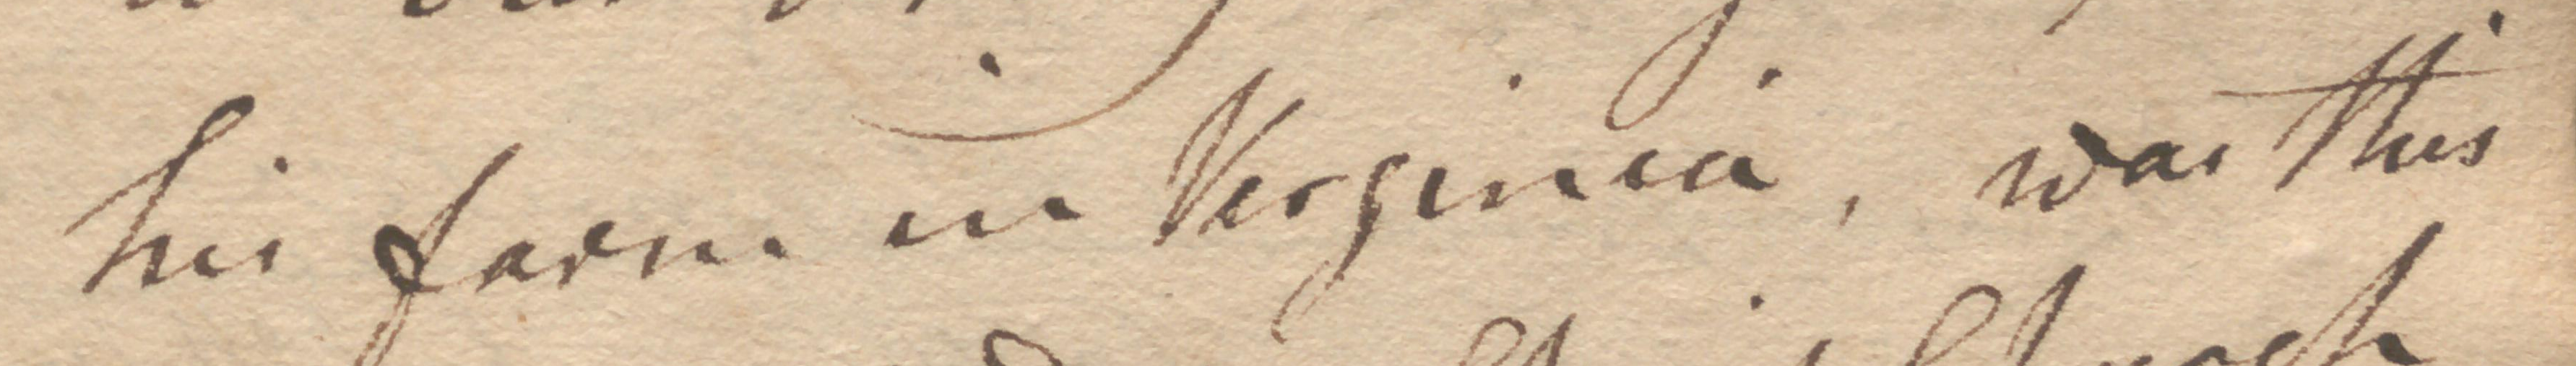his farm in Virgenia, was this
